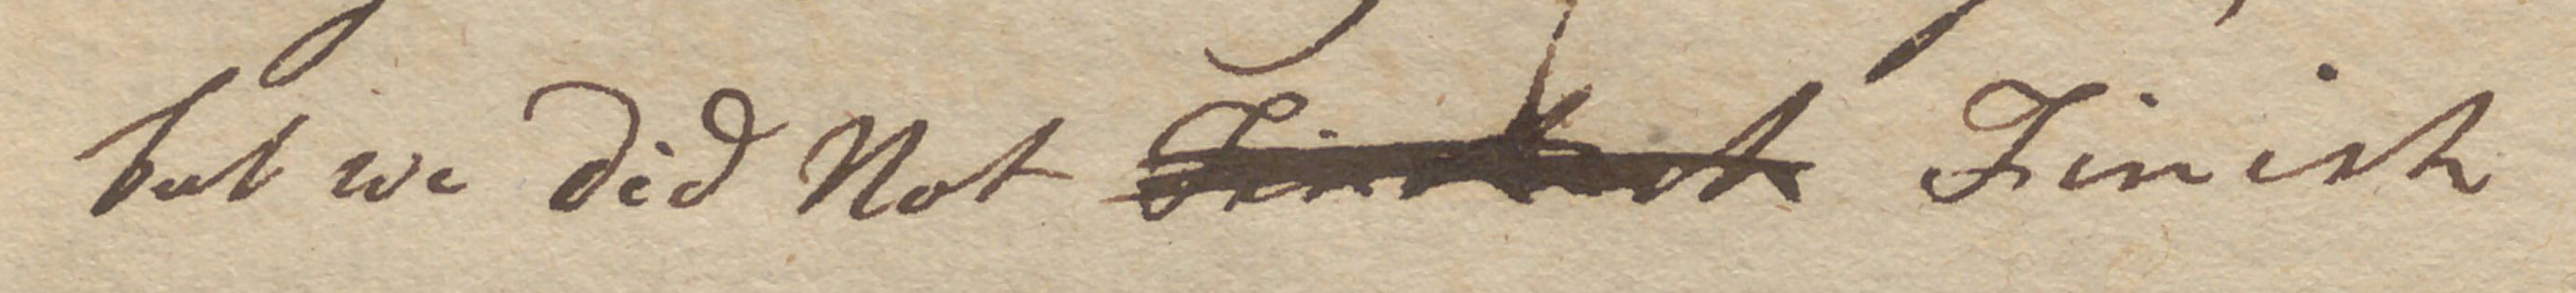but we did Not [_______] Finish
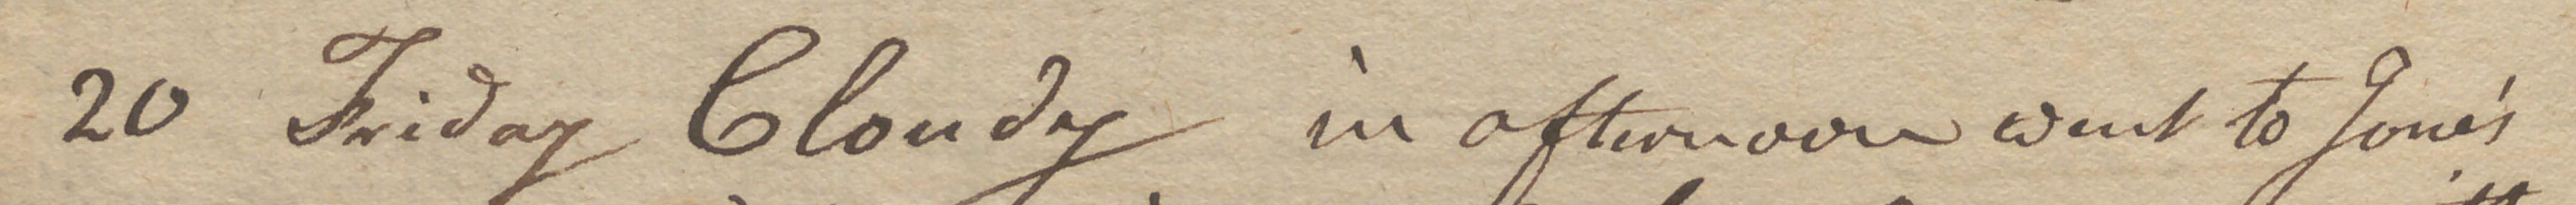20 Friday Cloudy in afternoon went to Jone's
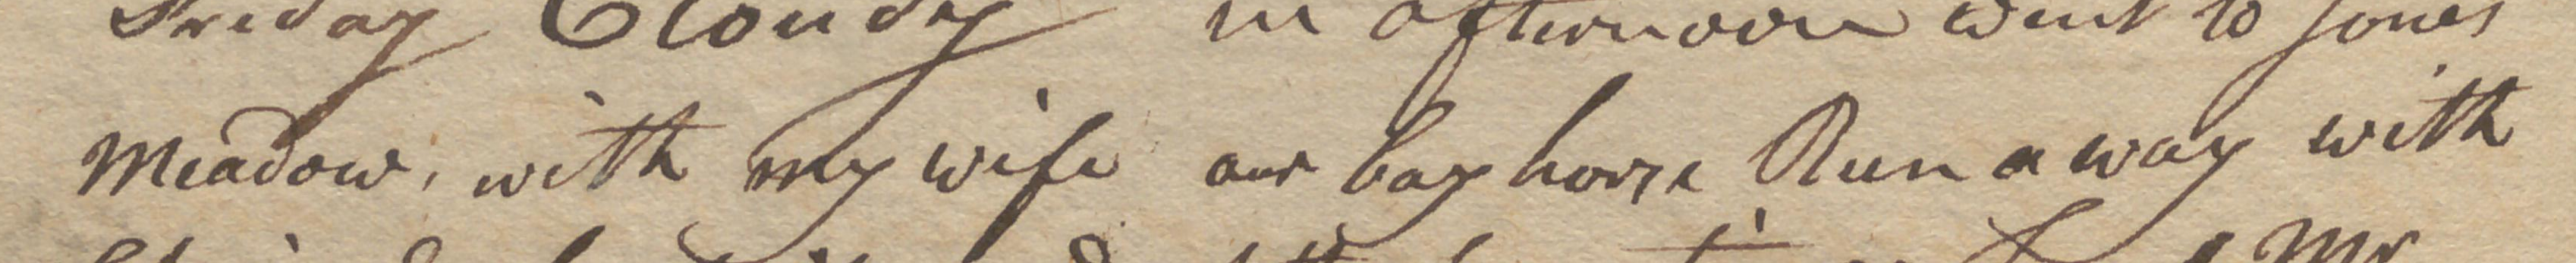Meadow, with my wife our bay horse Run a way with
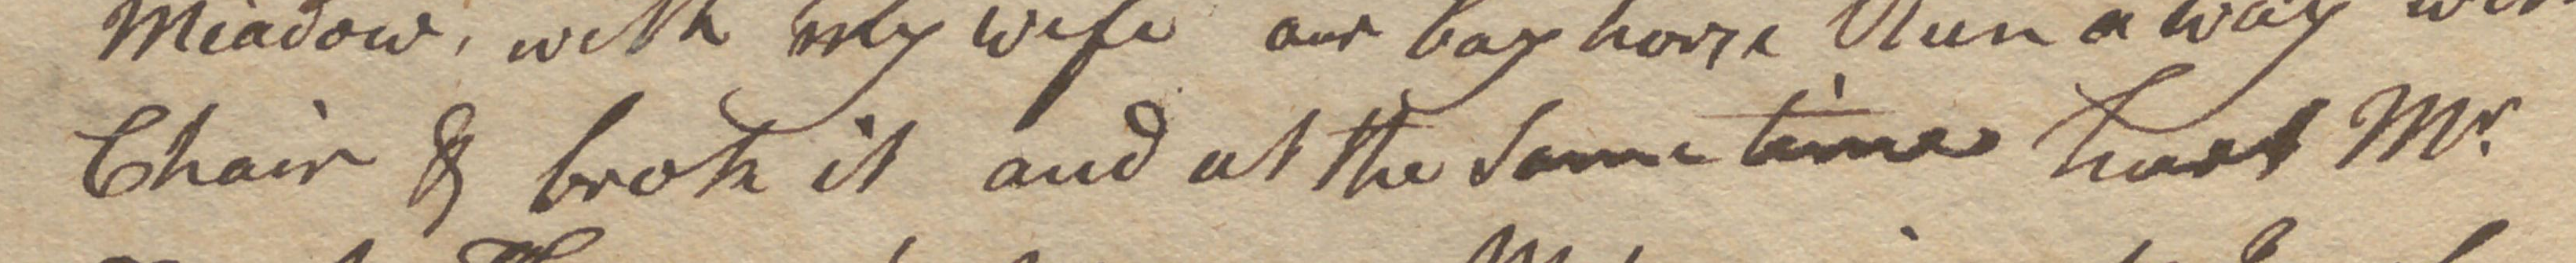Chair & brok it and at the some time hurt M^r.
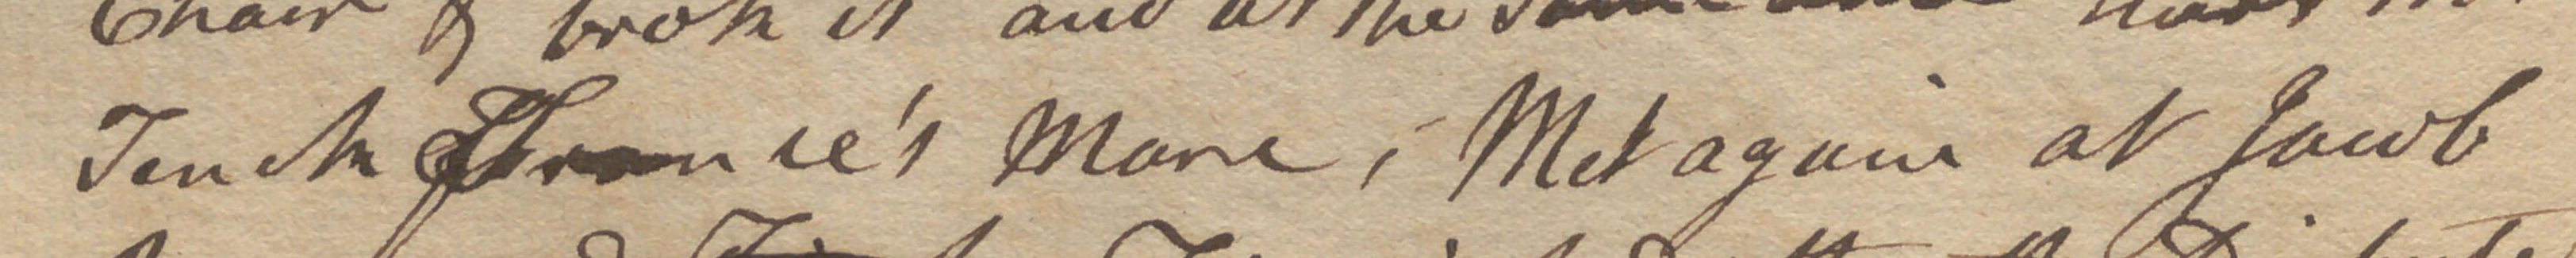Tench France's Mare, Met again at Jacob
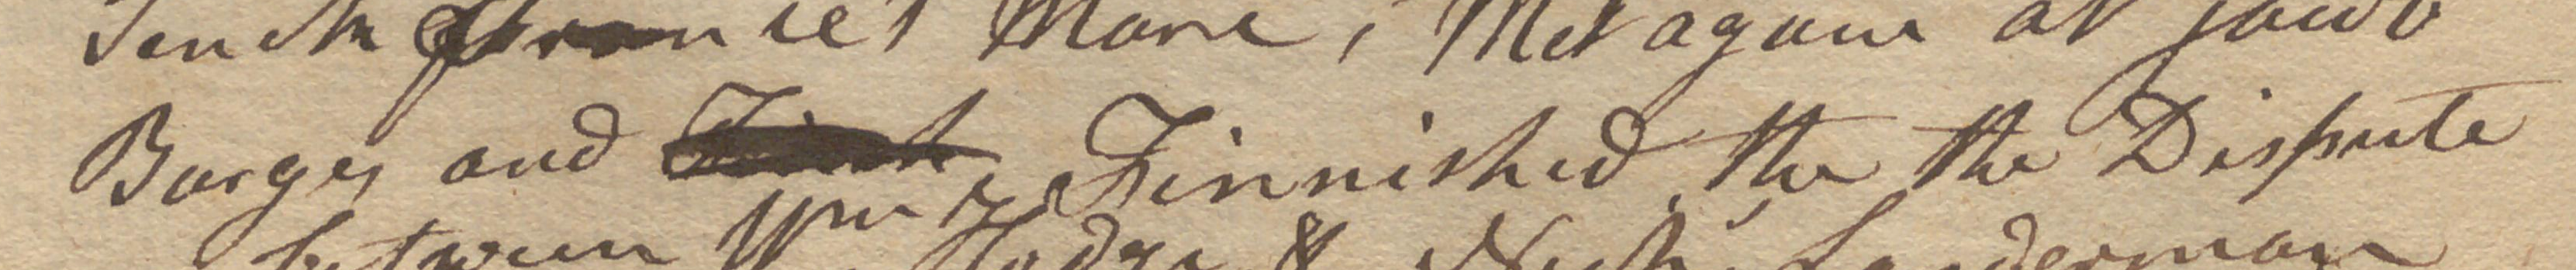Barges and [_____], Finnished the the Dispute
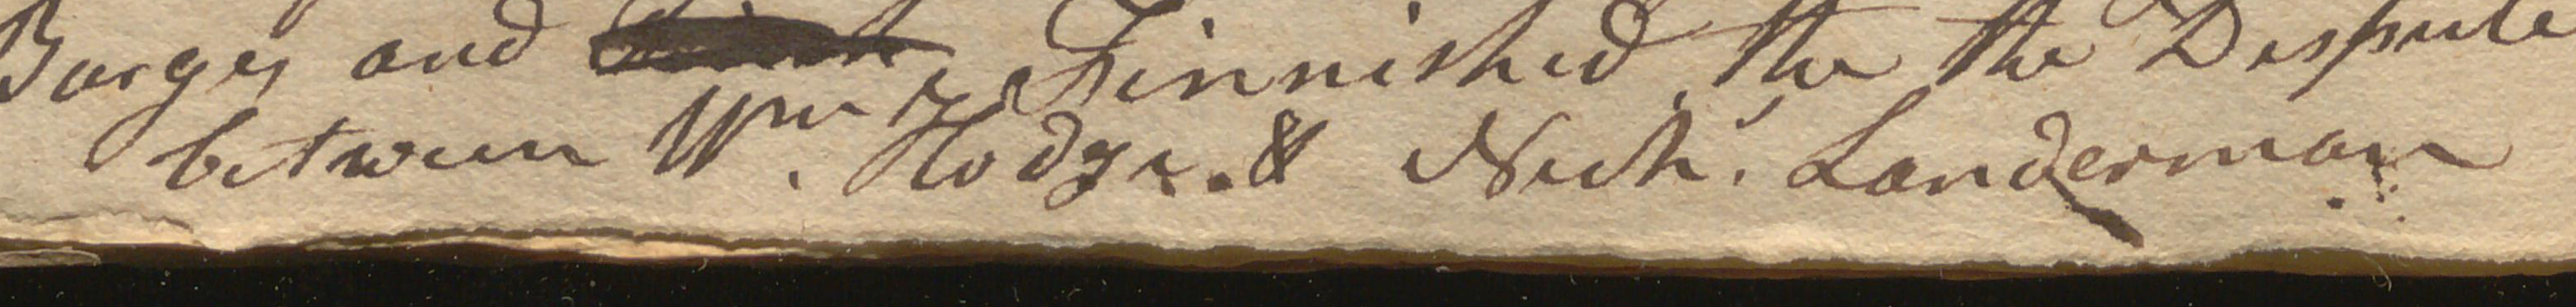between W^m. Hodge & Nech Landerman
